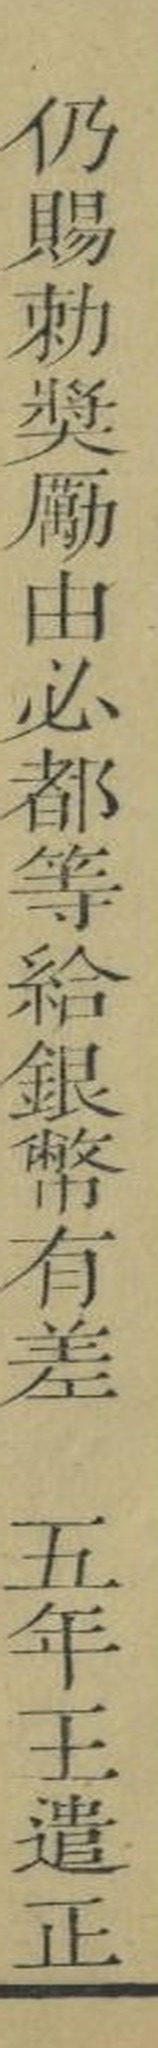仍賜勅奨励由必都等給銀幣有差五年王遣正
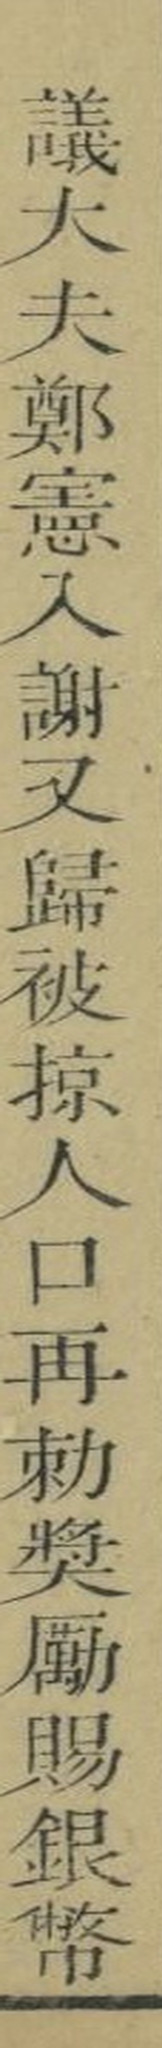議大夫鄭憲入謝又帰被掠人口再勅奨励賜銀幣
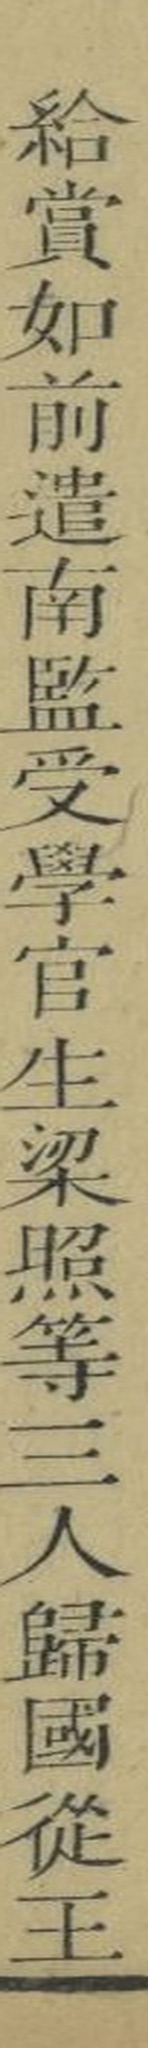給賞如前遣南監受学官生梁照等三人帰国従王
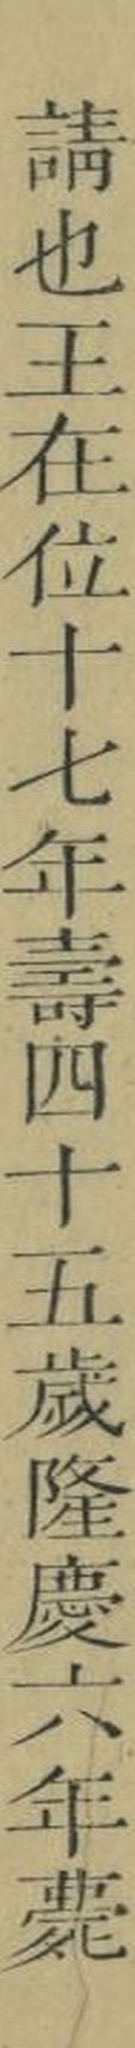請也王在位十七年寿四十五歳隆慶六年薨
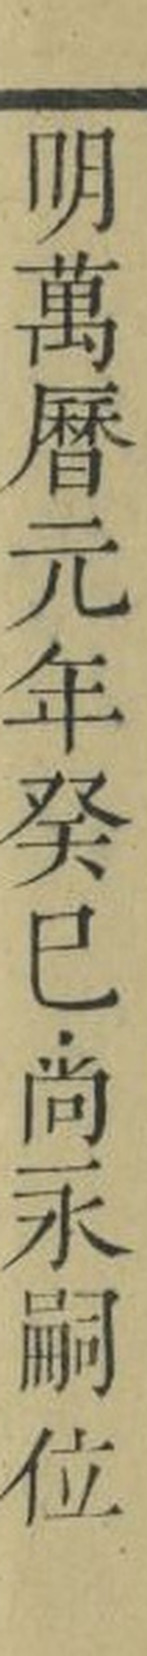明万暦元年癸巳尚永嗣位
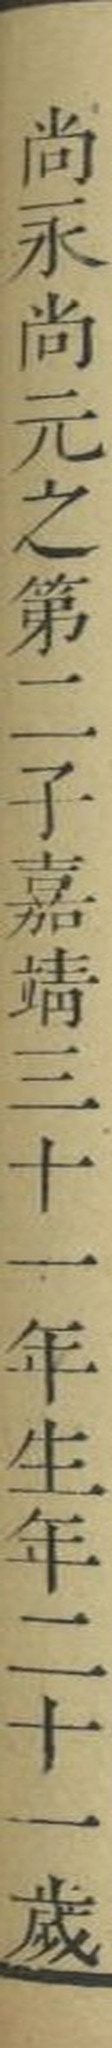尚永尚元之第二子嘉靖三十一年生年二十一歳
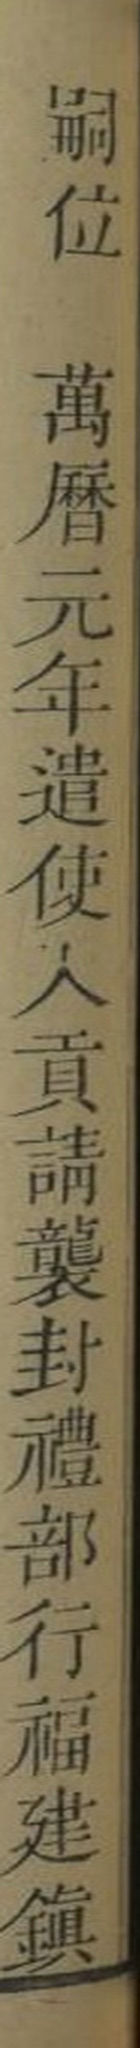嗣位万暦元年遣使入貢請襲封礼部行福建鎮
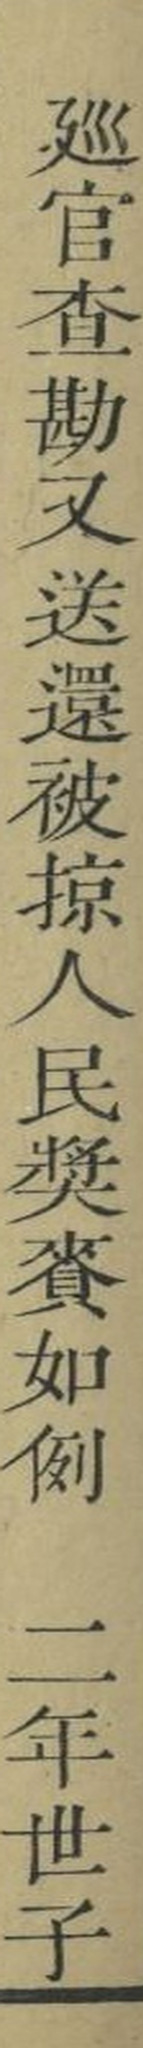巡官査勘又送還被掠人民奨賚如例二年世子
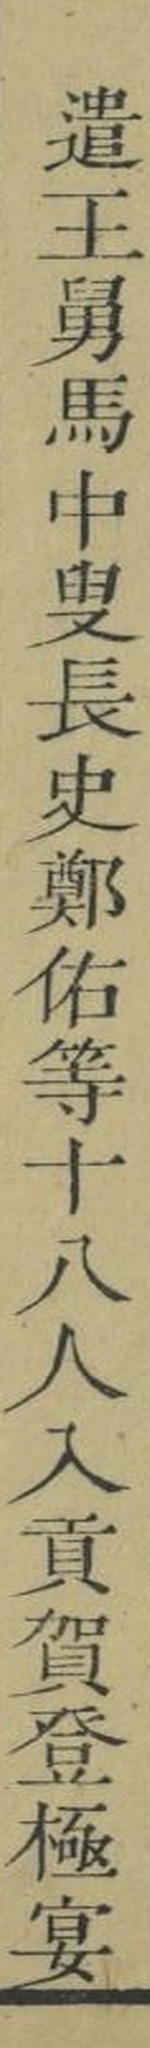遣王舅馬中叟長史鄭佑等十八人入貢賀登極宴
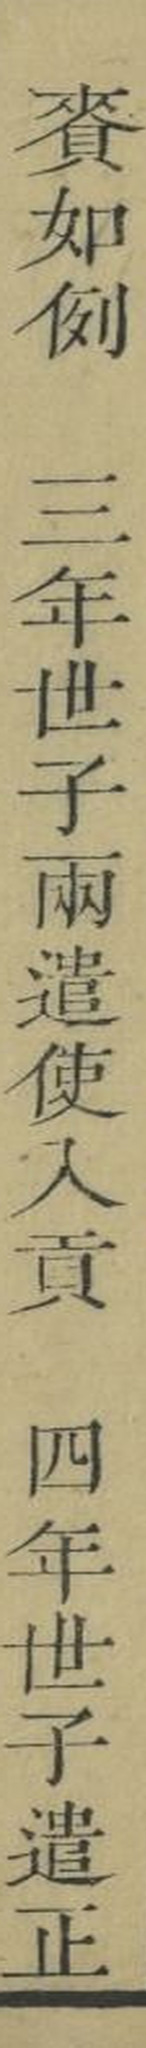賚如例三年世子両遣使入貢四年世子遣正
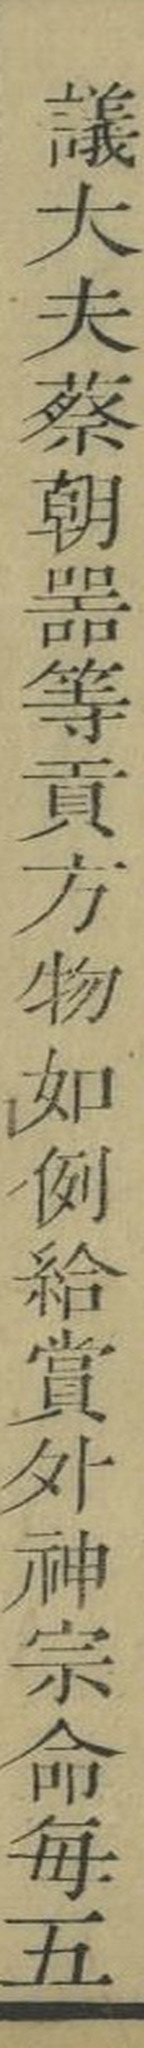議大夫蔡朝器等貢方物如例給賞外神宗命毎五
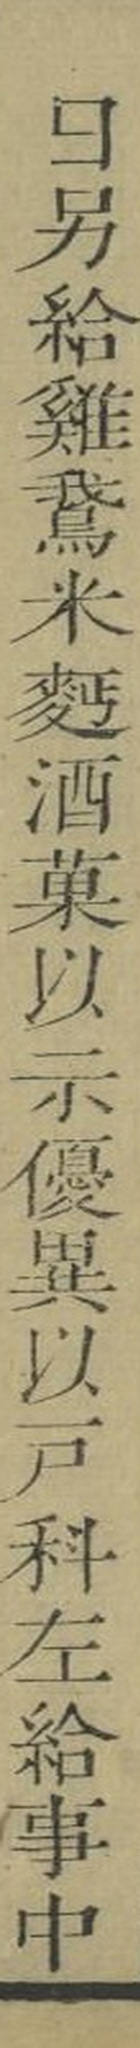日另給鶏鵞米麪酒菓以示優異以戸科左給事中
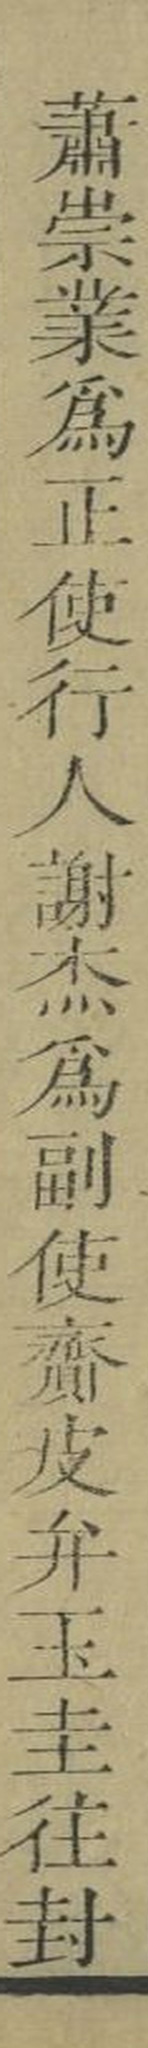蕭崇業為正使行人謝杰為副使齎皮弁玉圭往封
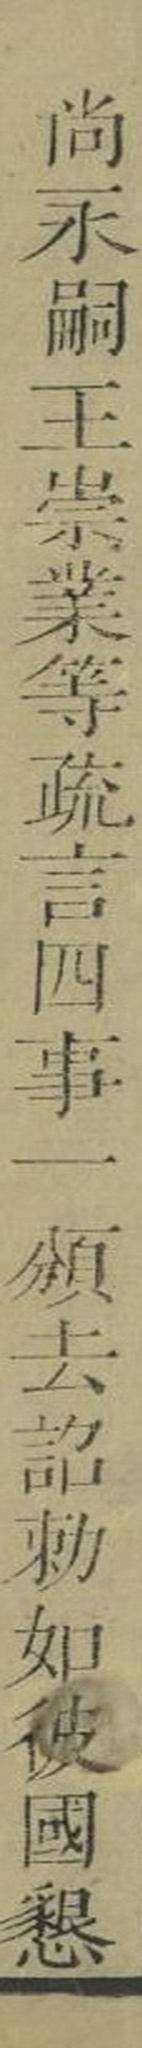尚永嗣王崇業等疏言四事一頒去詔勅如彼国懇
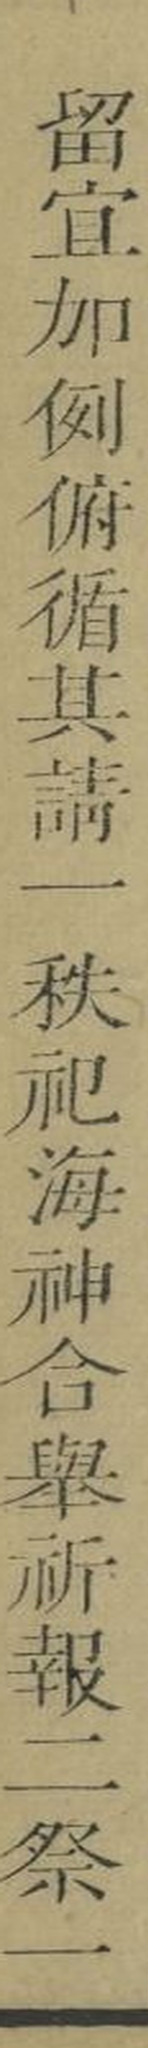留宜加例俯循其請一秩祀海神合挙祈報二祭一

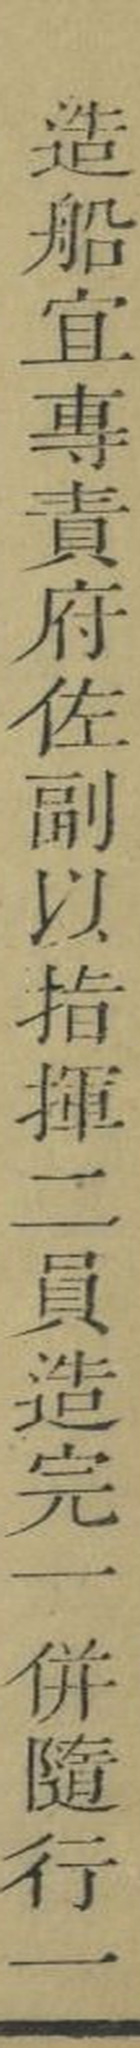造船宜専責府佐副以指揮二員造完一併随行一
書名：中山伝信録 巻三
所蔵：University of the Ryukyus Library
